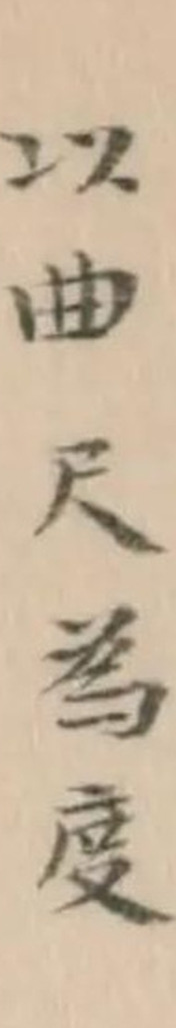以曲尺為度
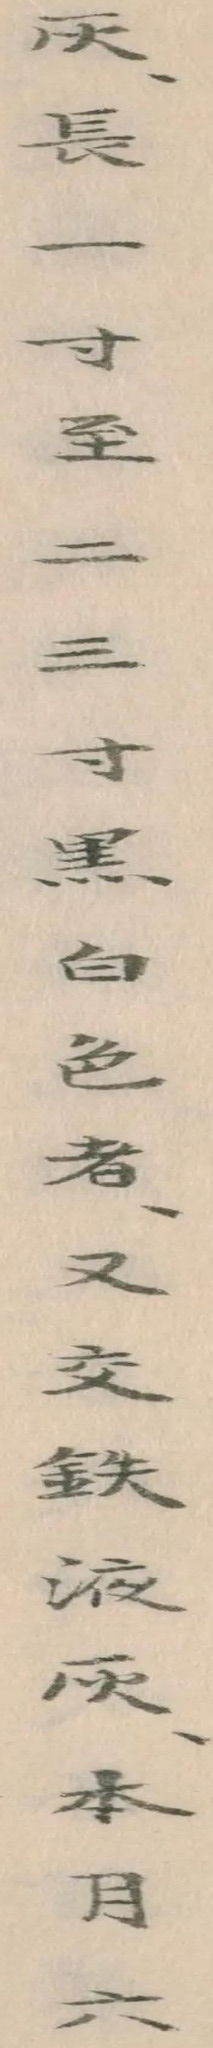灰、長一寸至二三寸黒白色者、又交鉄液灰、本月六
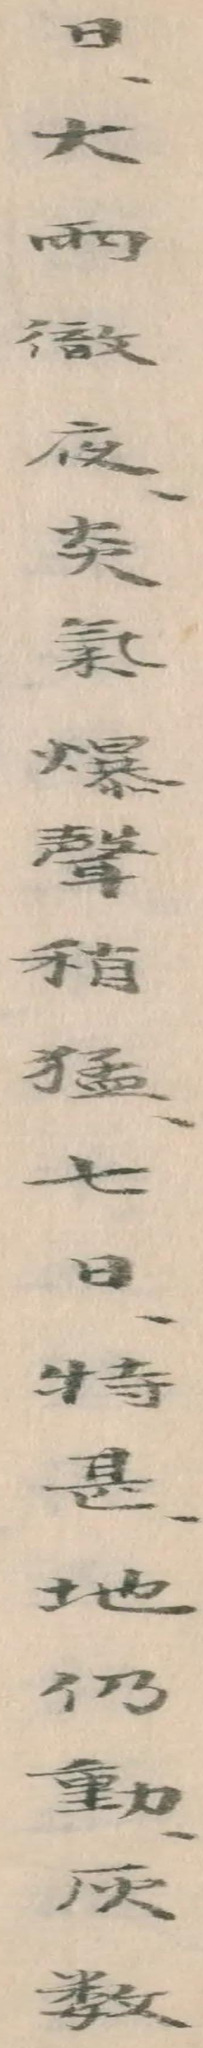日、大雨徹夜、炎気爆声稍猛、七日、特甚、地仍動、灰数
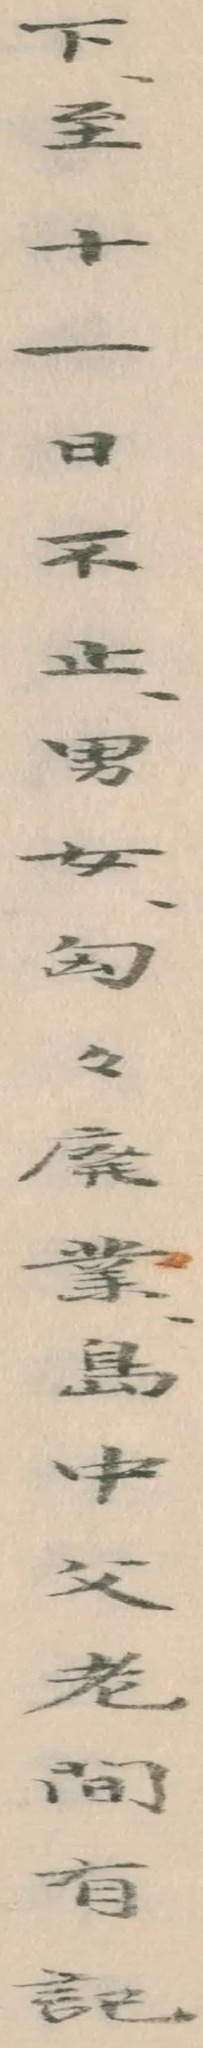下、至十一日不止、男女、匈々廃業、島中父老間有記
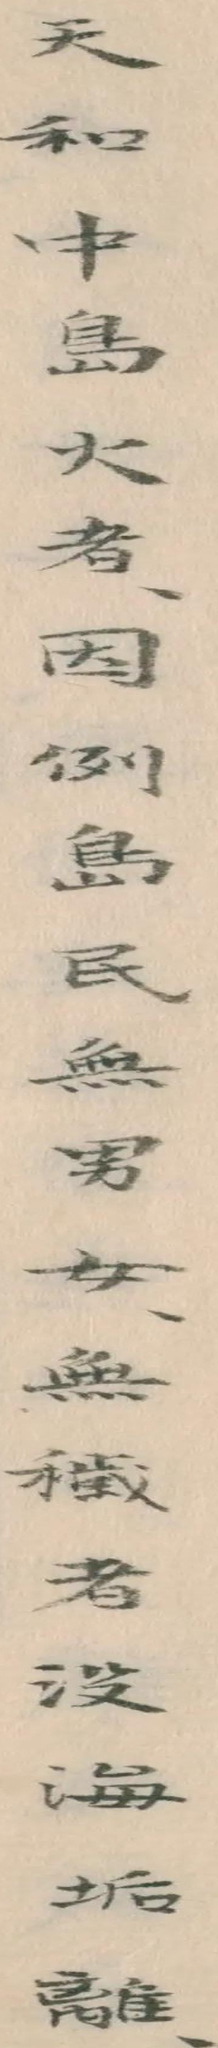天和中島火者、因例島民無男女、無穢者没海垢離、
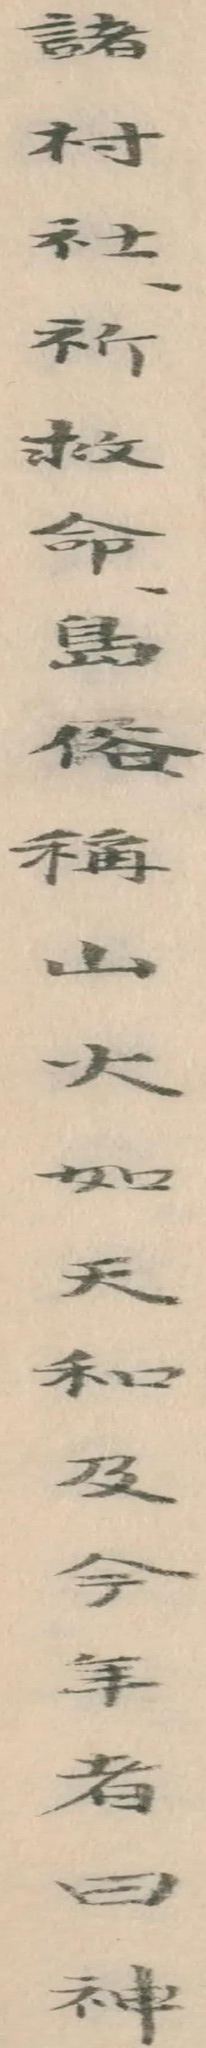諸村社、祈救命、島俗称山火如天和及今年者曰神

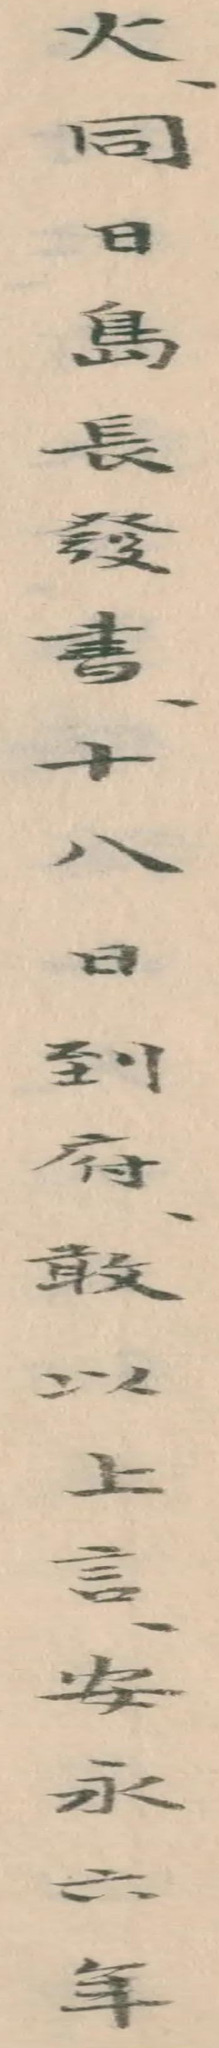火、同日島長発書、十八日到府、敢以上言、安永六年
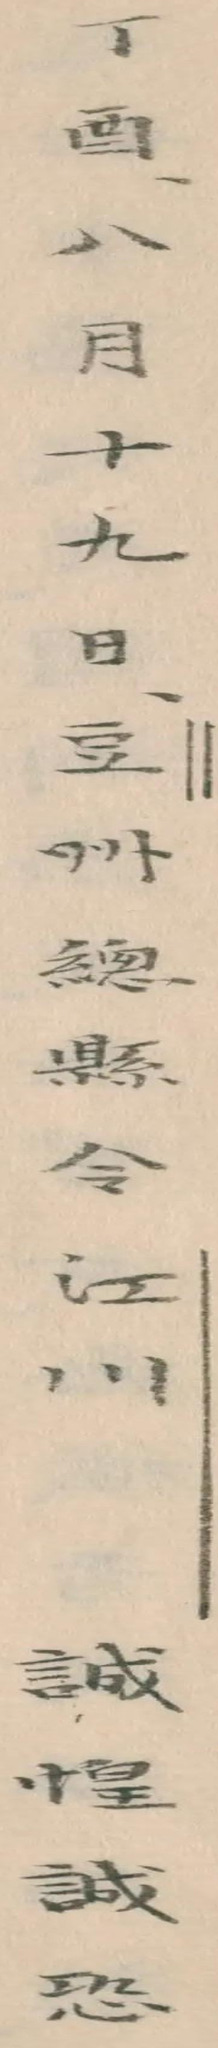丁酉、八月十九日、豆州総県令江川誠惶誠恐
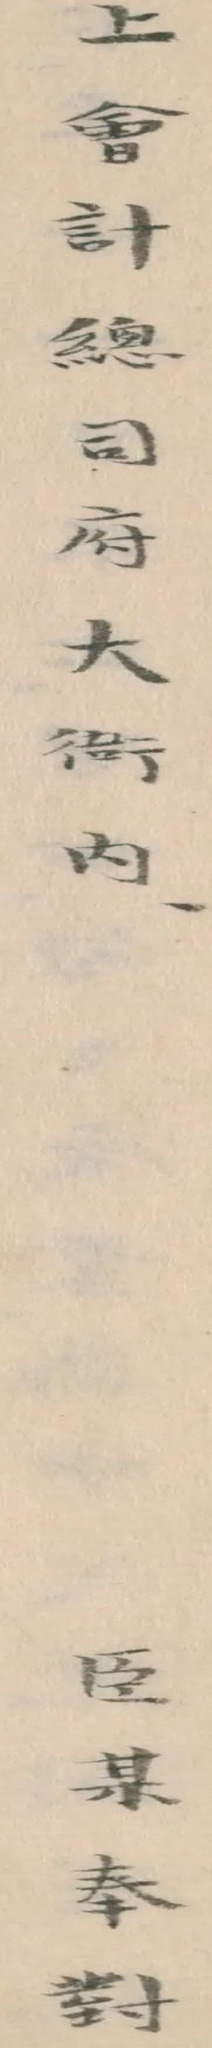上会計総司府大衙内、臣某奉対
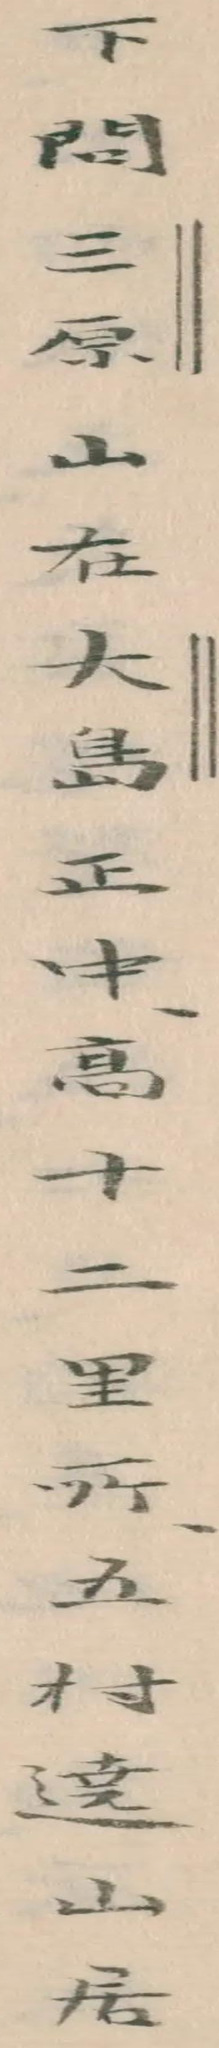下問三原山在大島正中、高十二里所、五村達山居
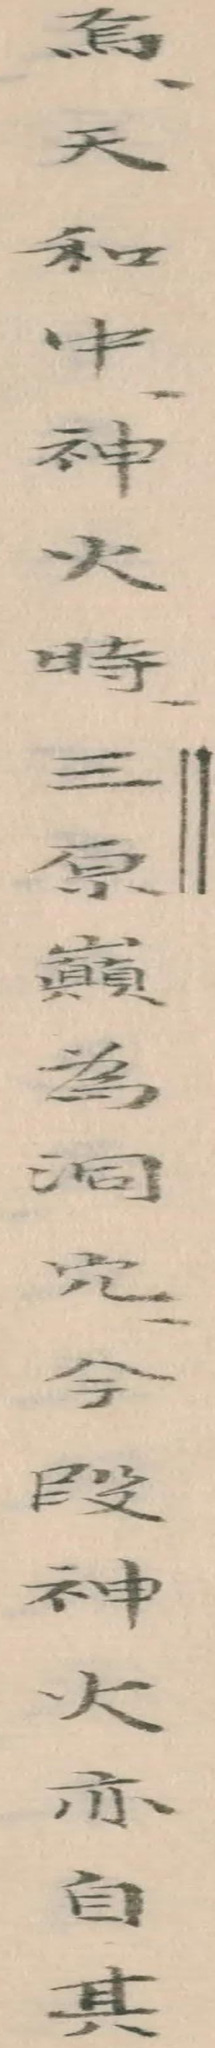焉、天和中、神火時、三原巓為洞穴、今段神火亦自其
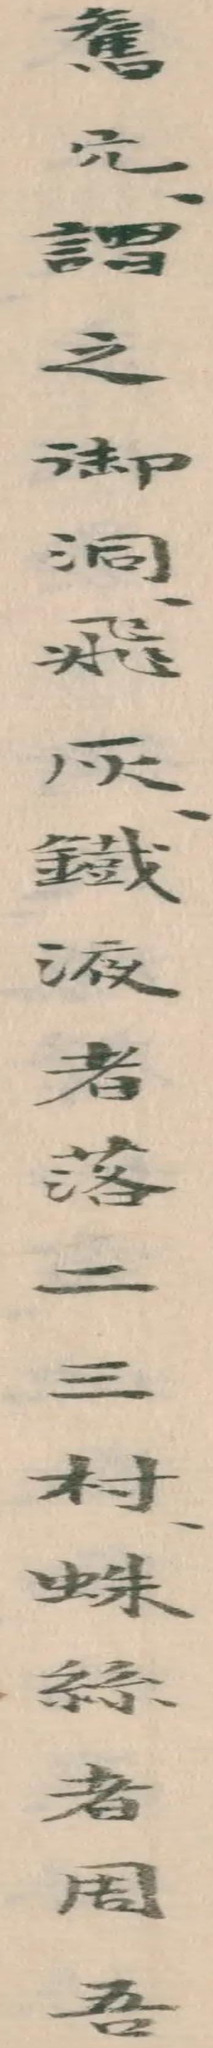旧穴、謂之御洞、飛灰、鉄液者落二三村、蛛絲者周吾
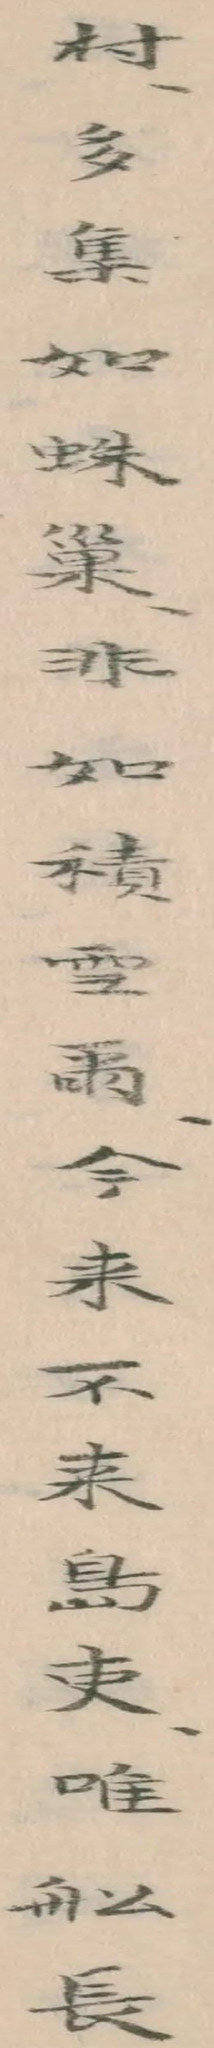村、多集如蛛巣、非如積雪爾、今来不来島吏、唯船長
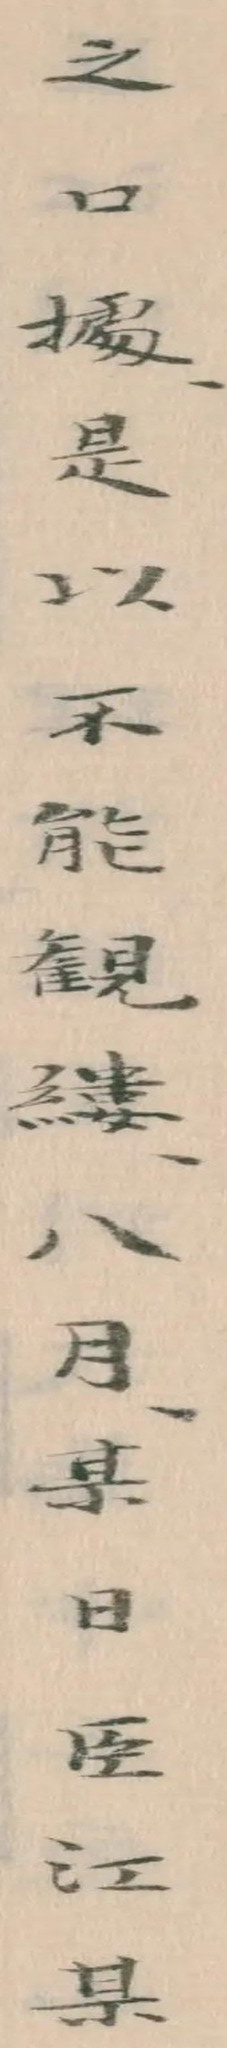之口拠、是以不能観縷、八月、某日臣江某
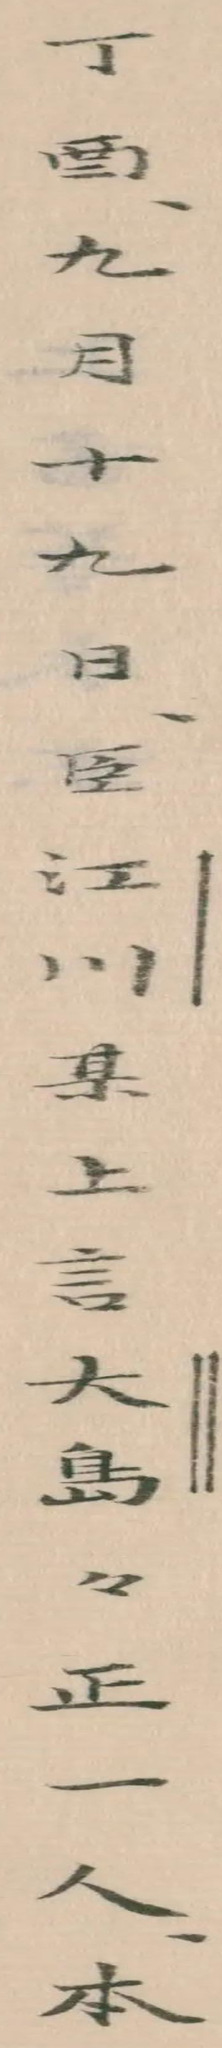丁酉、九月十九日、臣江川某上言大島々正一人、本
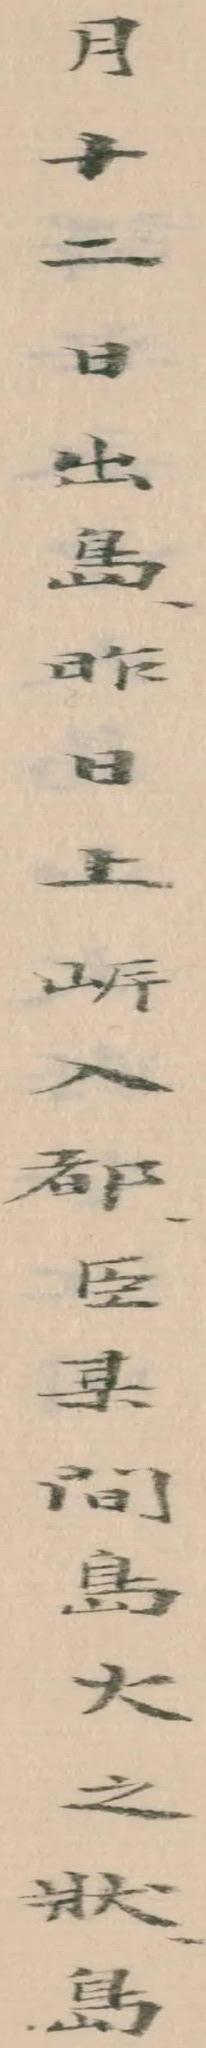月十二日出島、昨日上㟁入都、臣某間島火之状、島
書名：地災撮要. 巻11-12(地震之部)
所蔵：国立国会図書館 National Diet Library, JAPAN
